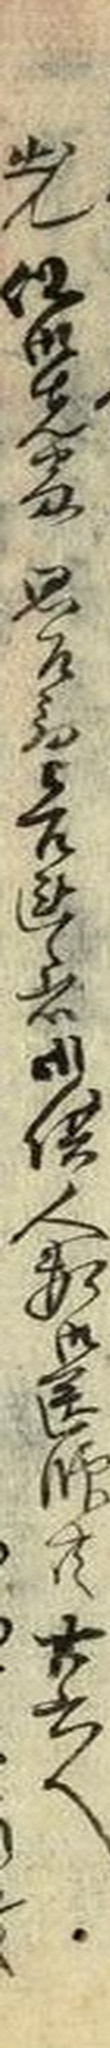出ル但御先番思召ニ而被召連候衆御供人数御医師共廿六人
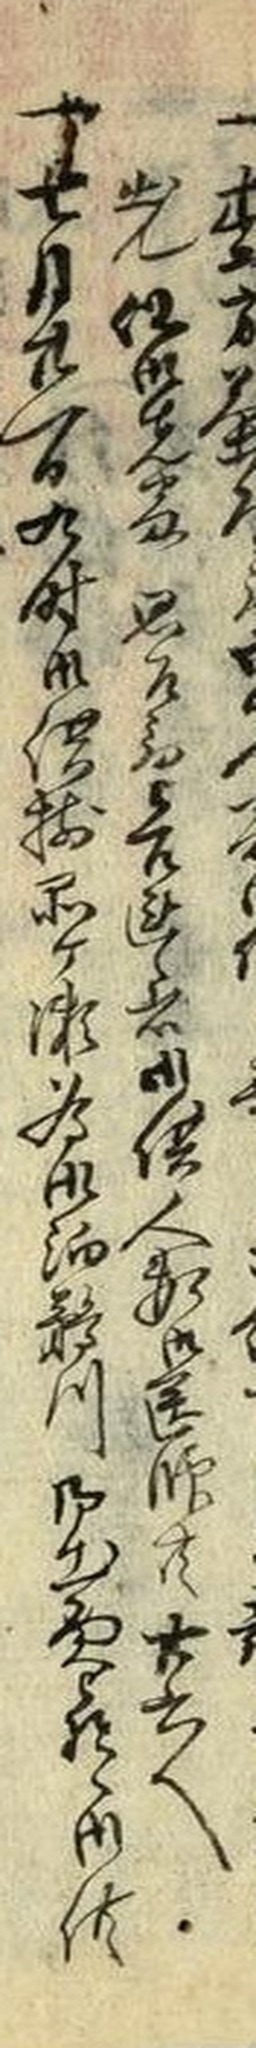一七月廿一日九時御供揃品ケ瀬為御泊鵜川御出殿被遊候御供
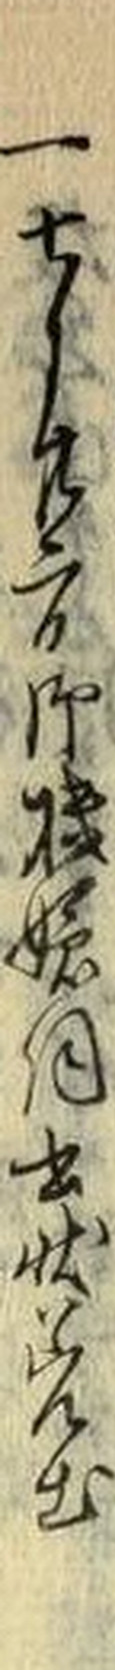一七月廿二日御機嫌伺書状差出
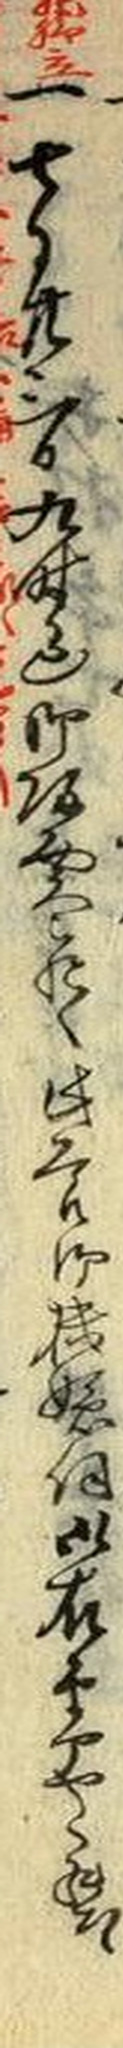一七月廿三日九時過御帰殿被遊候此節御機嫌伺御右筆部やへ罷出候
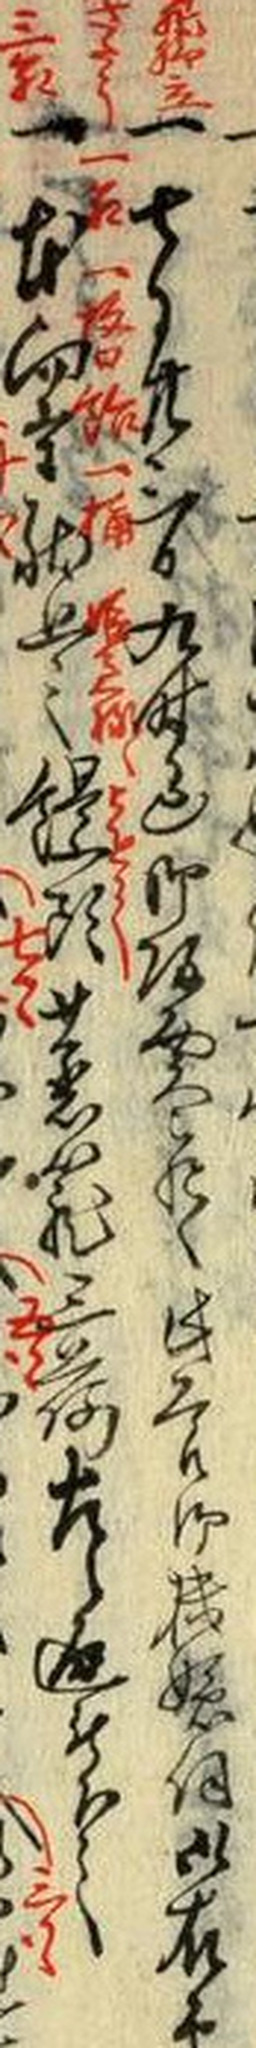一本向寺献上之饅頭蒸籠三荷左之通被下之
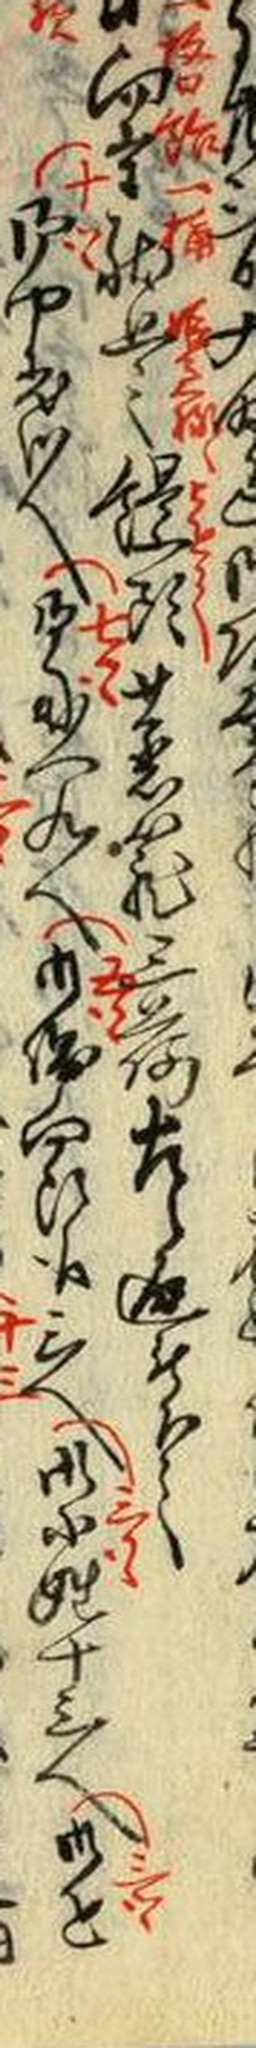御中老弐人御用人九人御側向頭取三人御小姓十三人御近
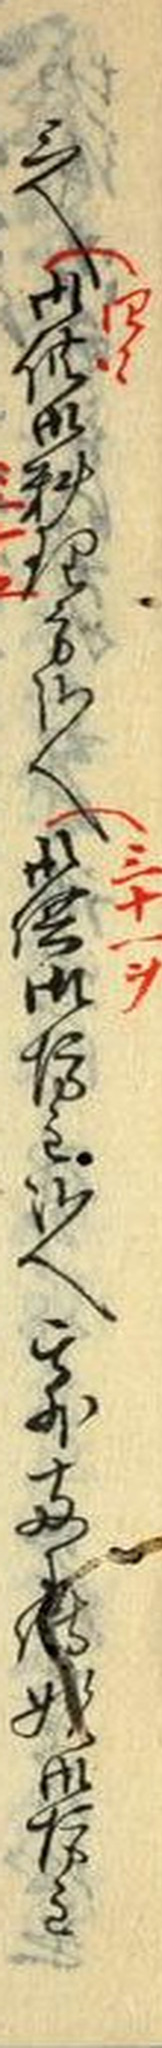三人御供御料理方弐人御供御坊主弐人其外両手伝始御坊主
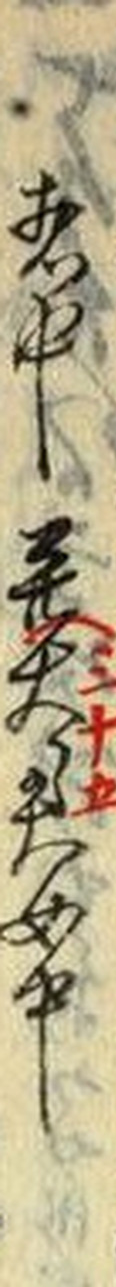惣中幷大奥女中
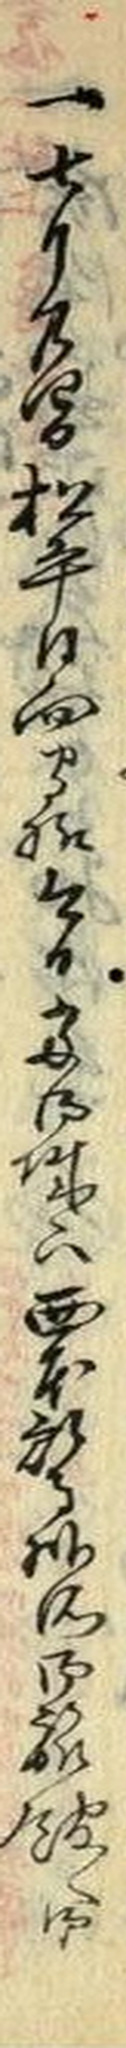一七月廿四日松平日向守様今日当御城下西本願寺掛所御旅館へ御
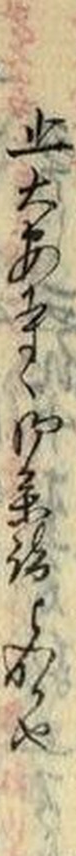止大安寺へ御参詣被成候由
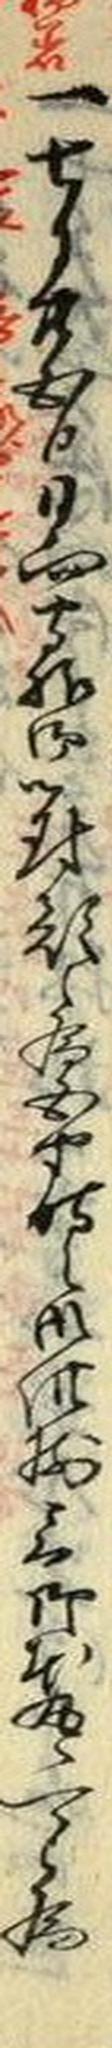一七月廿五日日向守様御対顔之為五半時之御供揃ニ而御本丸へ可被為
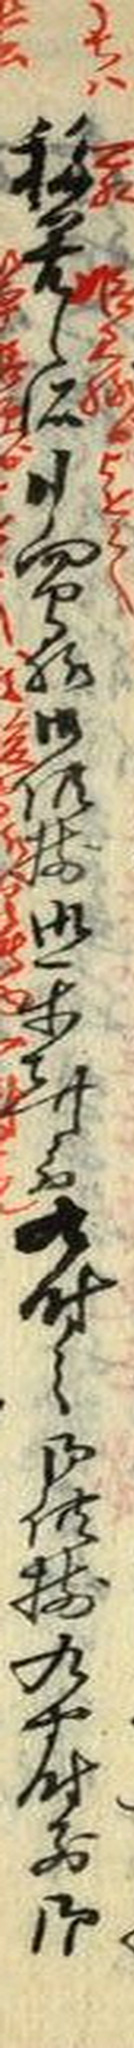移筈之所日向守様御供揃御遅刻ニ而九時之御供揃九半時前御
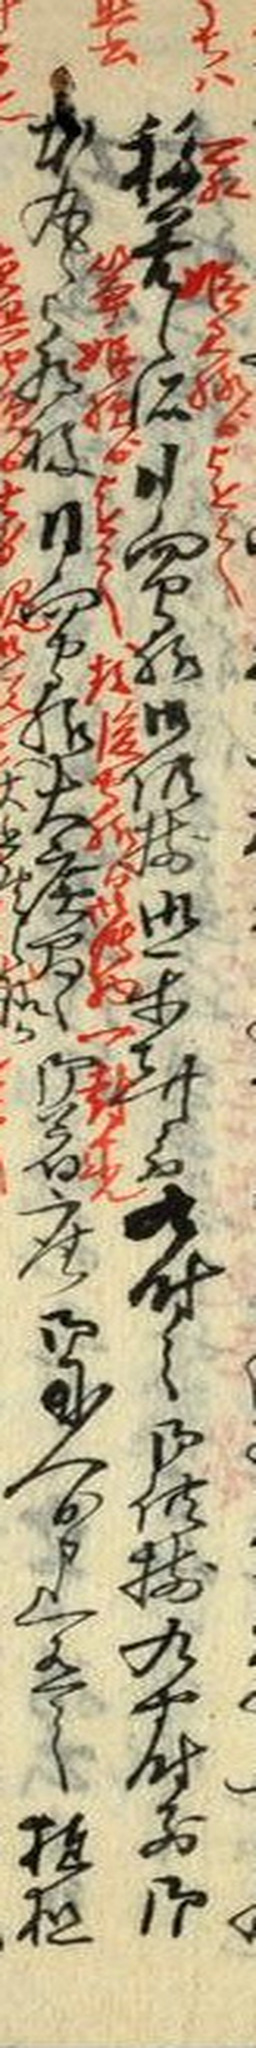本丸へ被為移日向守様大広間へ御着座御用人ゟ申上有之韃靼
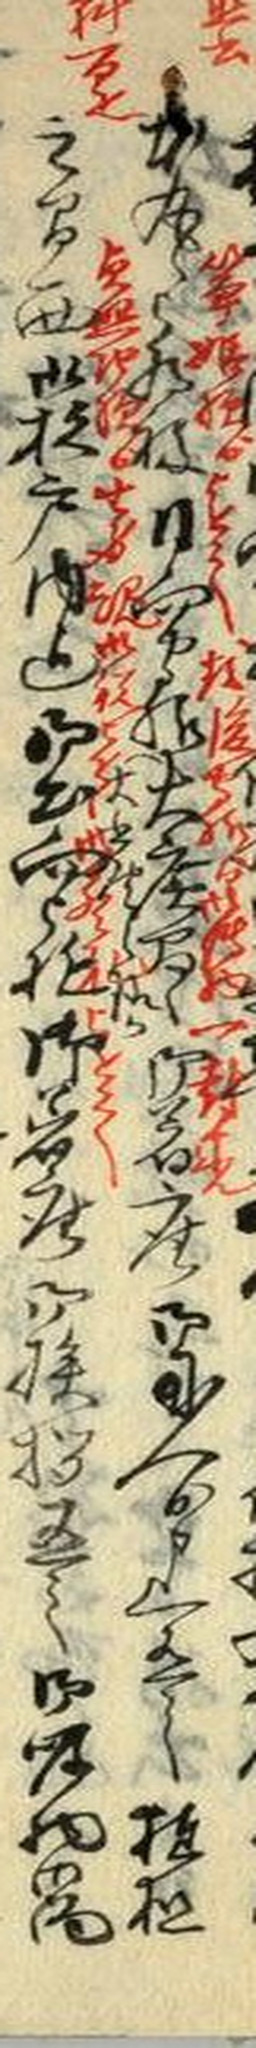之間西御杉戸内迄御出向被遊御着座御挨拶有之御吸物御酒
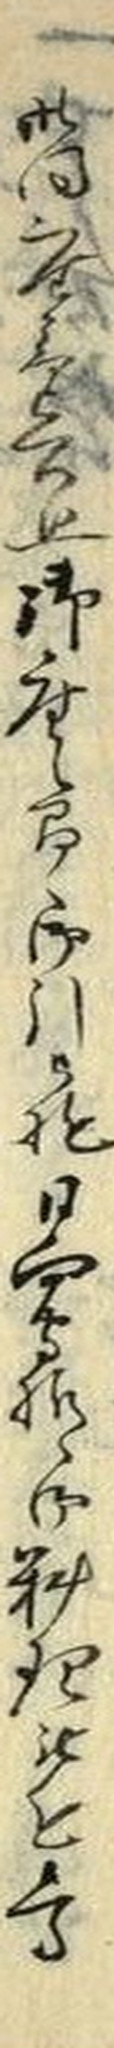御同座ニ而被召上御座之間へ御引被遊日向守様へ御料理被進鳥
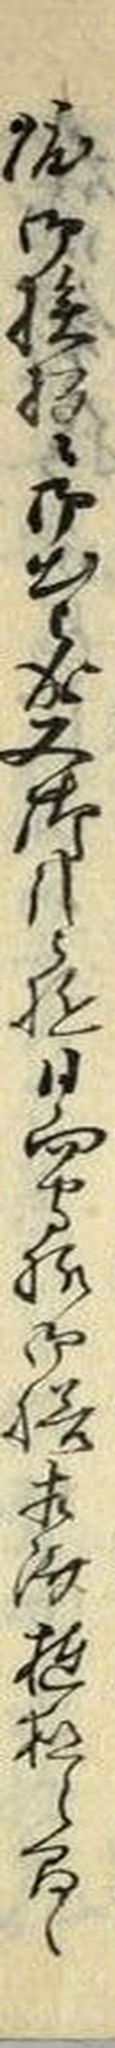渡御挨拶ニ御出被成又御引被遊日向守様御膳相済韃靼之間へ
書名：少傅日録抄（斉承付側向頭取日記、在国）
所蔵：福井県文書館 Fukui Prefectural Archives
